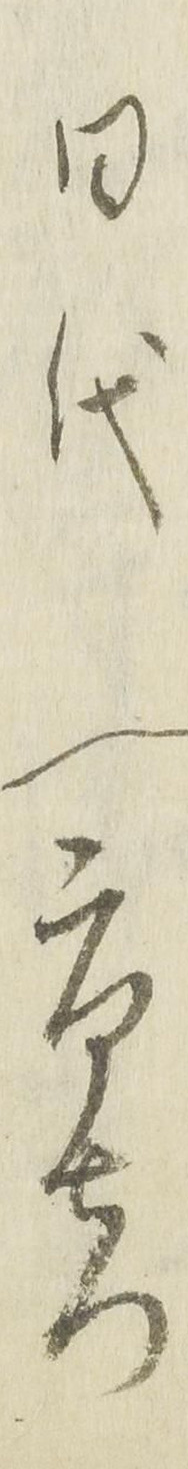田代市右衛門
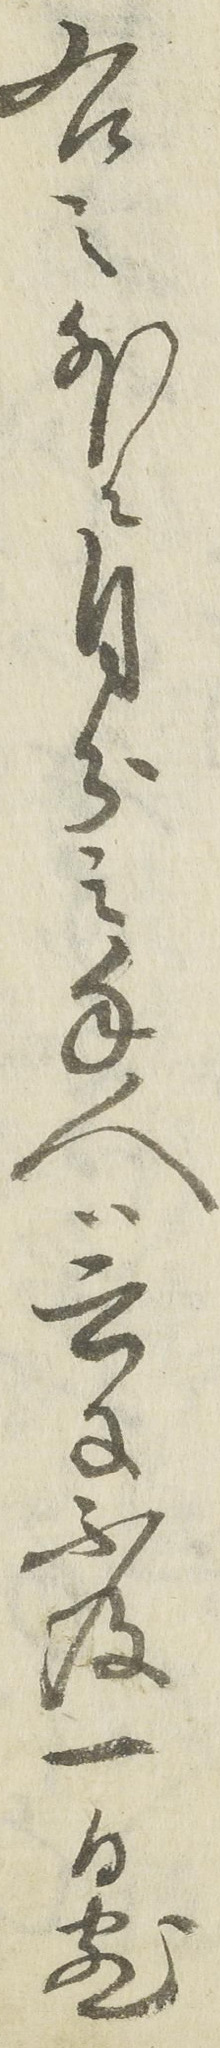右之外ニ自分之手人は云に不及一日宛
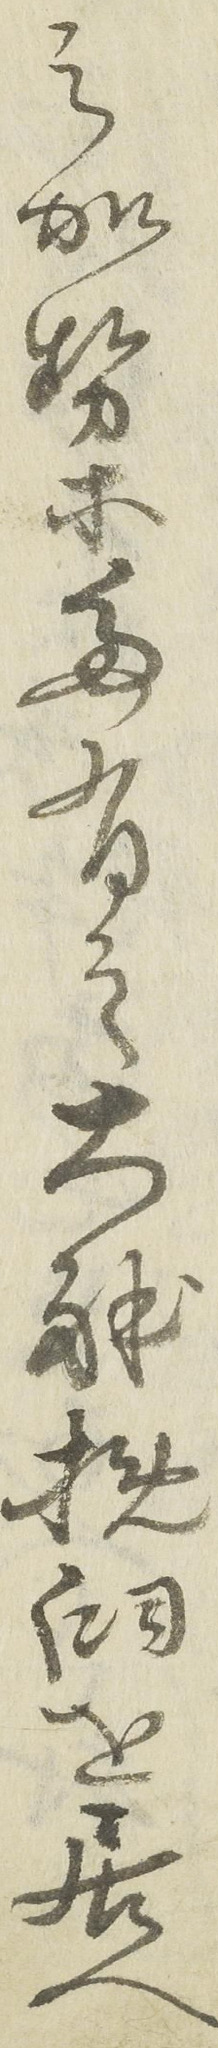之加勢等多有之大体挽臼を居へ
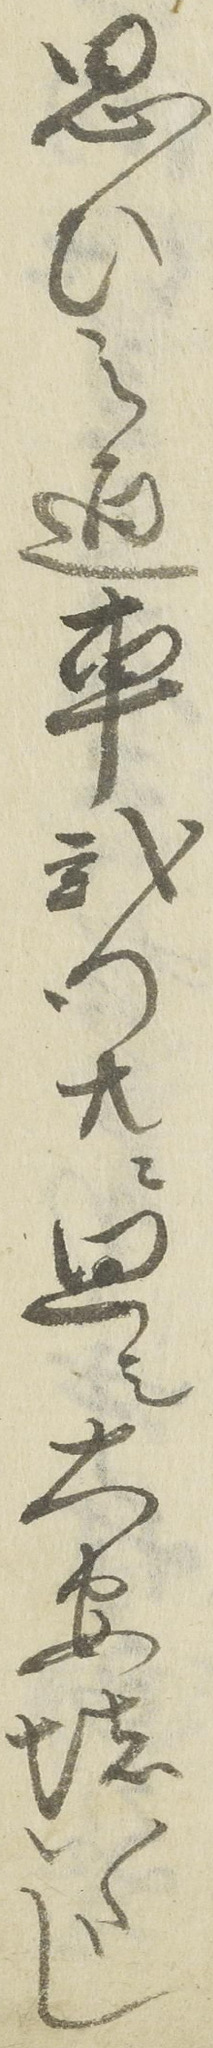思ひ之通車弐つ共ニ廻シ大安堵いたし

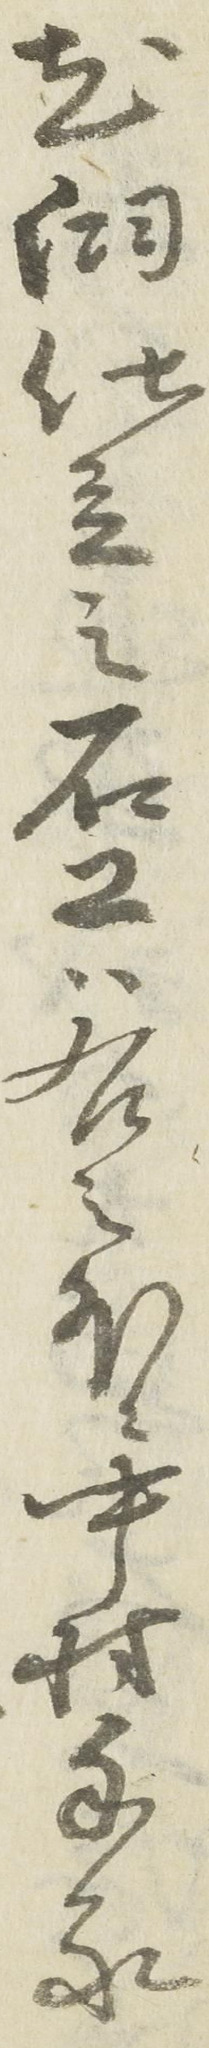尤臼仕立之石工は右之外ニ中村手永
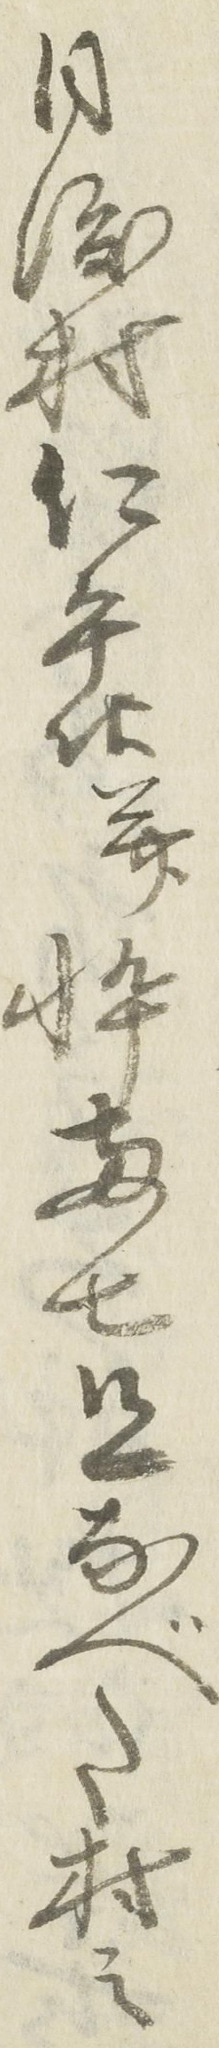目渡村仁平次幷忰両七且なべた村之
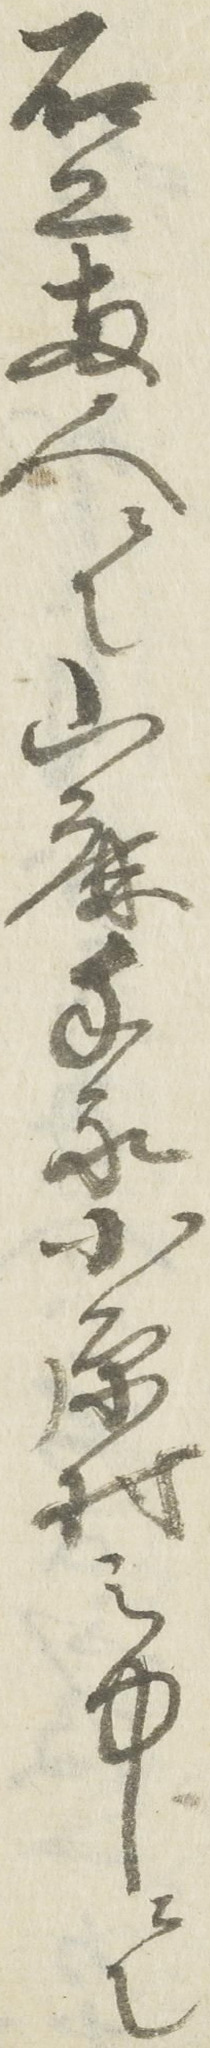石工両人ニて山鹿手永小原村之中ニて
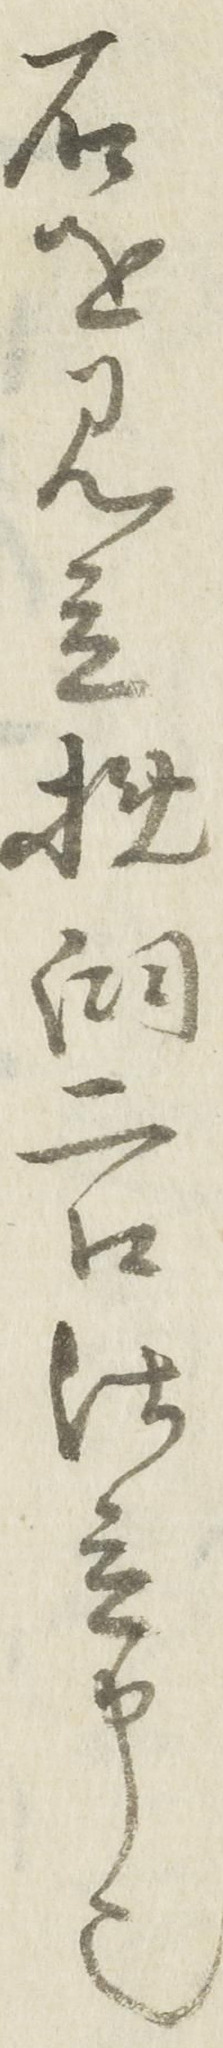石を見立挽臼ニ口仕立申也
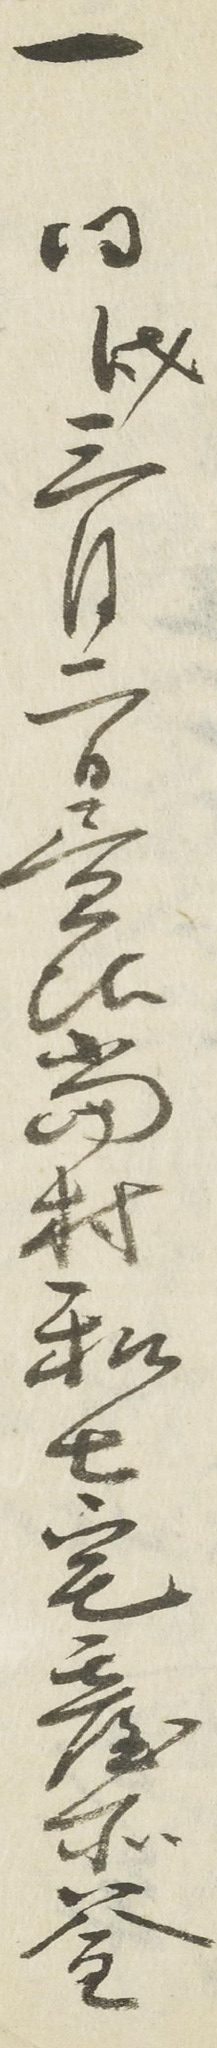一同戌三月二日昼比当村和七宅台所釜
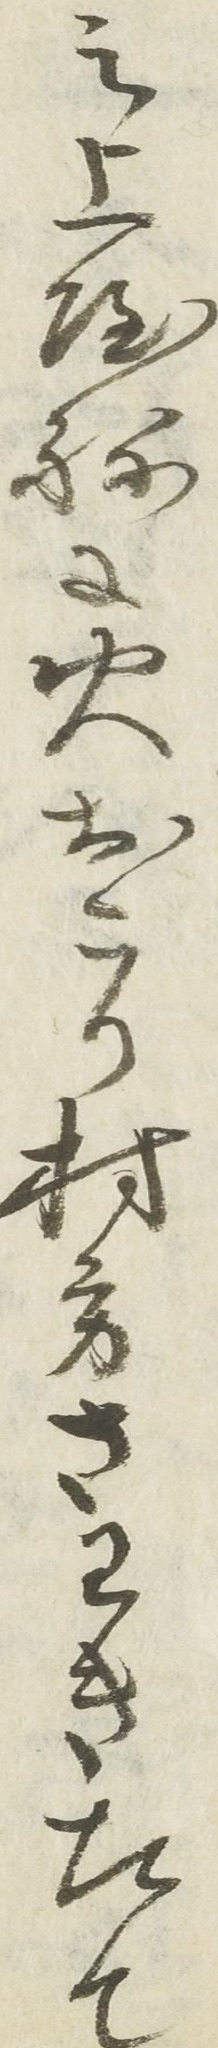之上屋ねに火おこり村方さわきたて
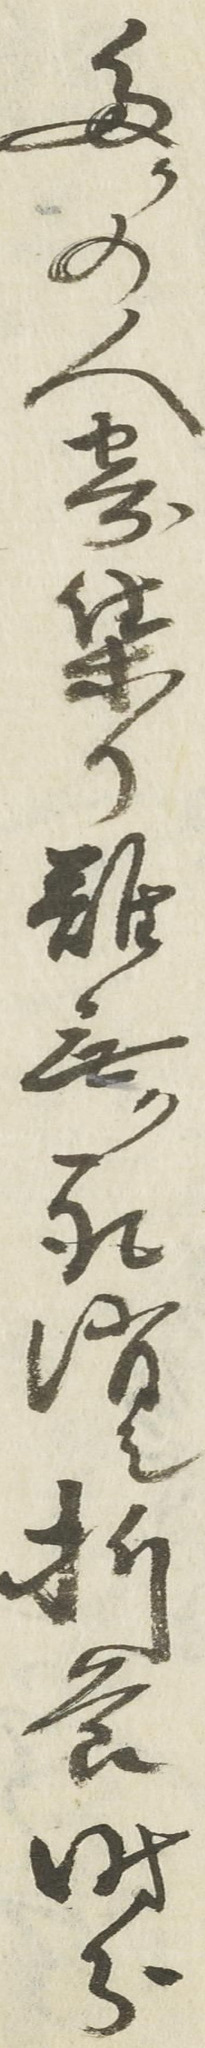多クの人寄集り難無ク取消シ折節時分
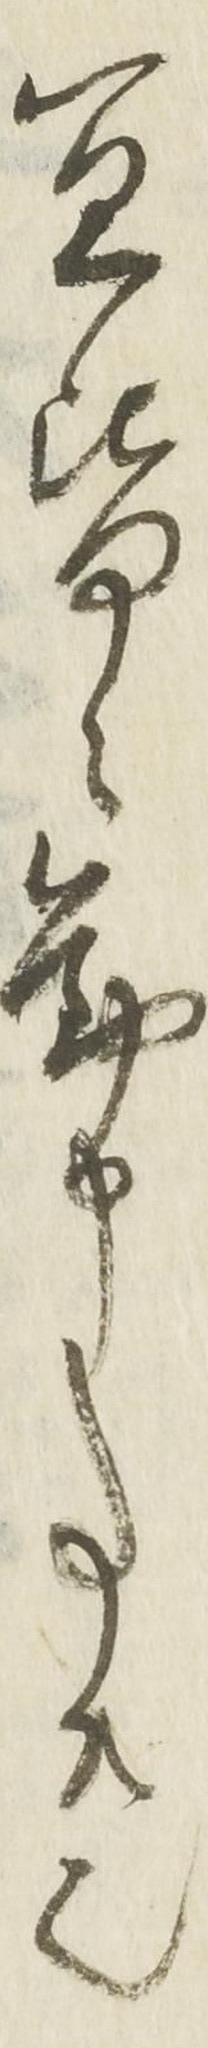宜皆〻勤申事共也
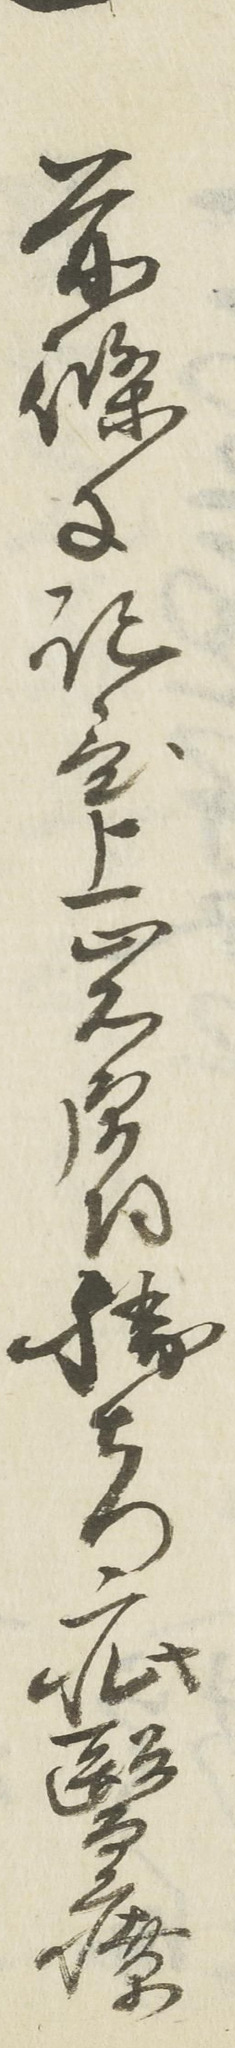一前条に記置上岩原村勝右衛門疵医療
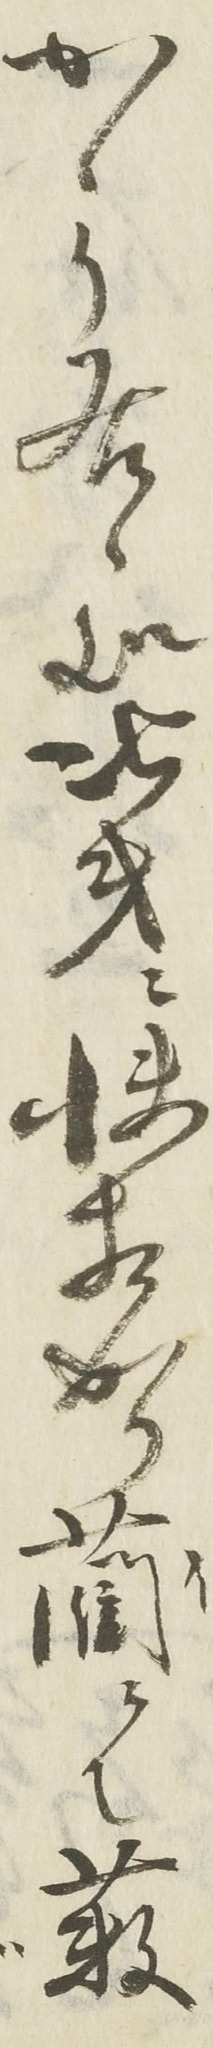かゝり居候処次第ニ快相成り藺ニて藪くゞり
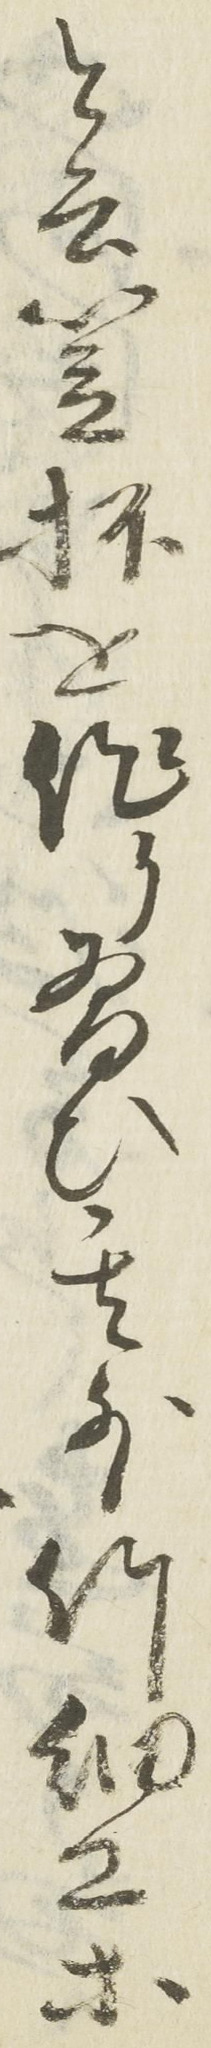と云笠抔を作り習ひ其外竹細工等
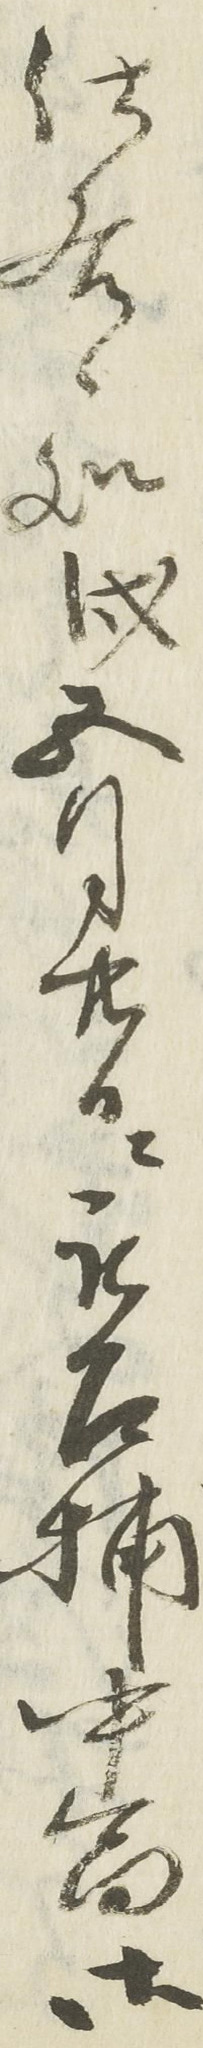仕居候処戌五月廿日ニ被召捕中富御
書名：後見笑
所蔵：東京大学地震研究所図書室 Earthquake Research Institute Library, The University of Tokyo, JAPAN
